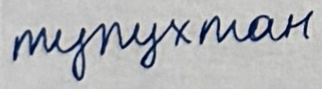тупухтан
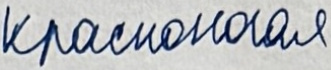красноногая
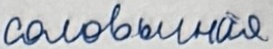соловьиная
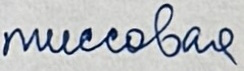тиссовая
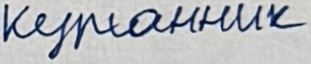курганник
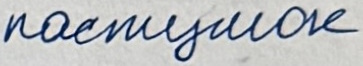пастушок
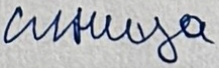синица
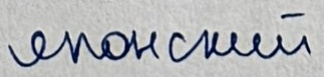японский
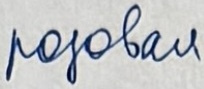розовая
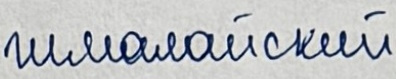гималайский
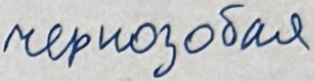чернозобая
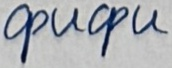фифи
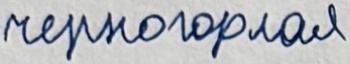черногорлая
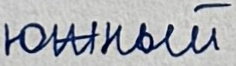южный
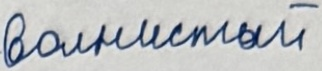волнистый
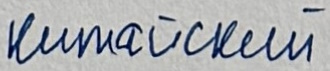китайский
